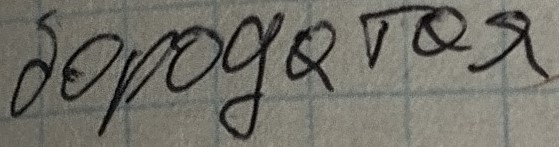бородатая
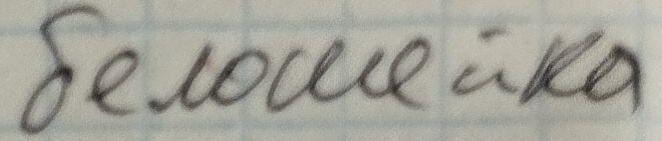белошейка
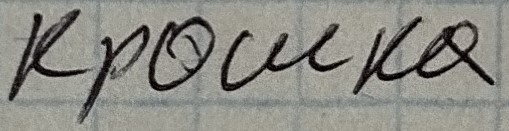крошка
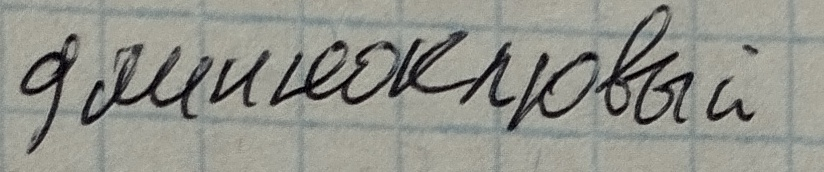длинноклювый
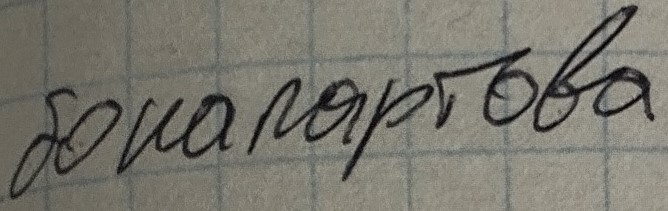бонапартова
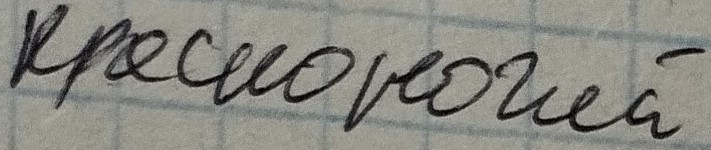красноногий
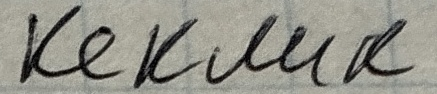кеклик
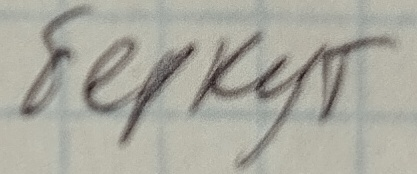беркут
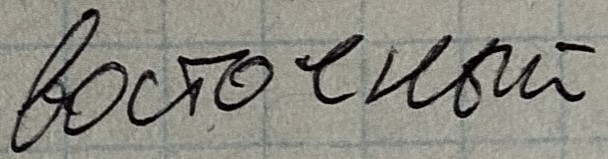восточный
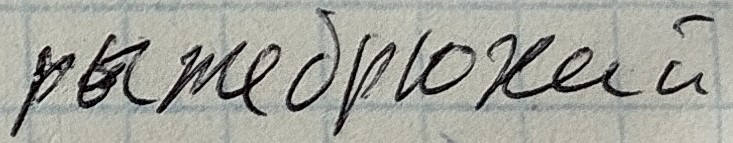рыжебрюхий
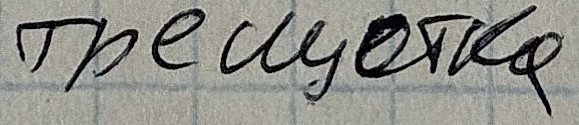трещотка
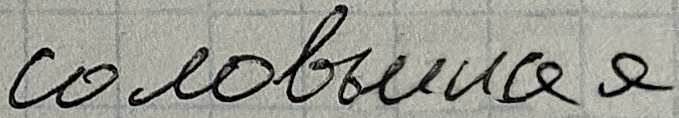соловьиная
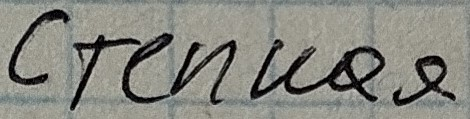степная
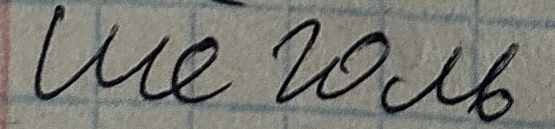ше голь
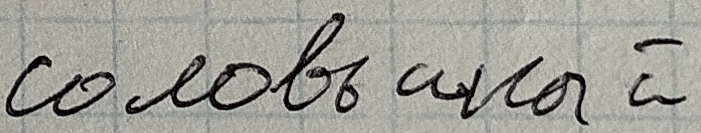соловьиный
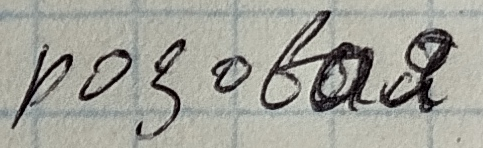розовая
